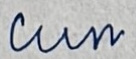сип
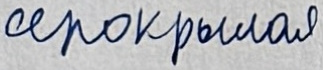серокрылая
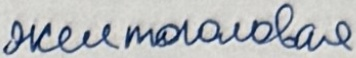желтоголовая
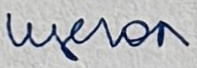щегол
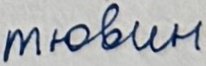тювин
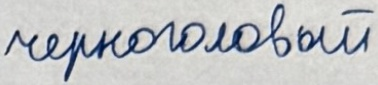черноголовый
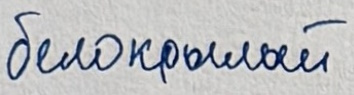белокрылый
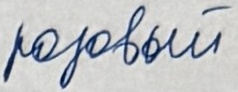розовый
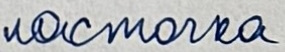ласточка
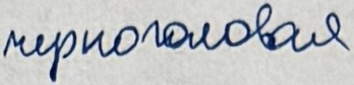черноголовая
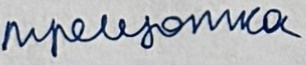трещотка
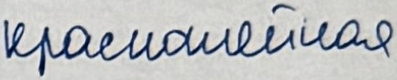красношейная
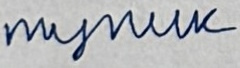тупик
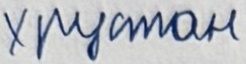хрустан
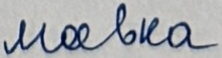моевка
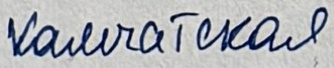камчатская
